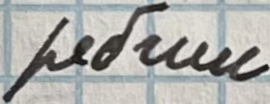рябчик
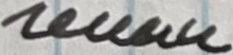чекан
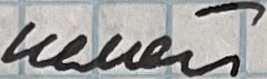немой
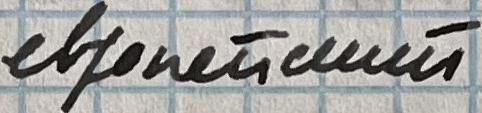европейский
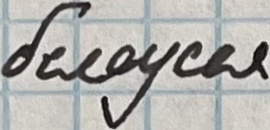белоусая
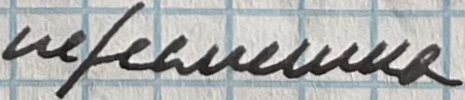пересмешка
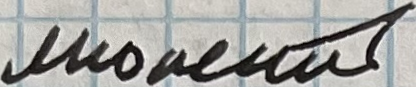японский
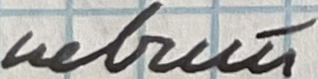певчий
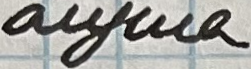олуша
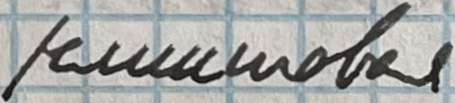реликтовая
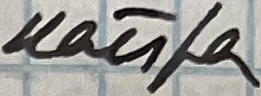кайра
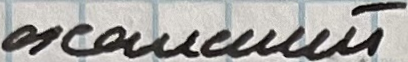охотский
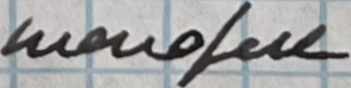топорок
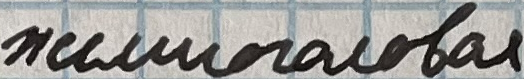желтоголовая
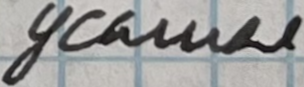усатая
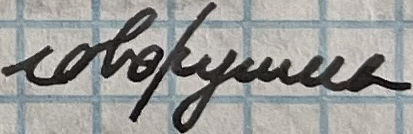говорушка
